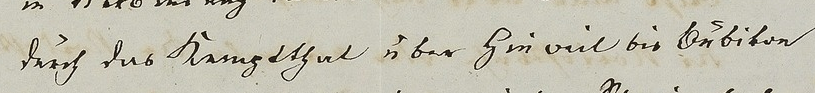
durch das Kemptthal über Hinweil bis Bubikon
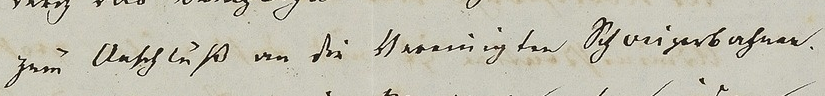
zum Anschluß an die Vereinigten Schweizerbahnen.
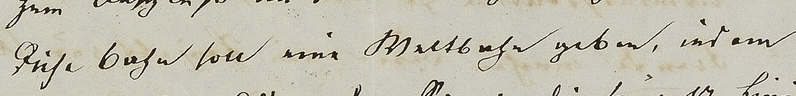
Diese Bahn soll eine Weltbahn geben, indem
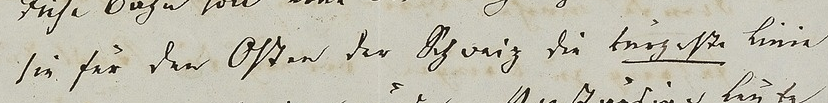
sie für den Osten der Schweiz die kürzeste Linie
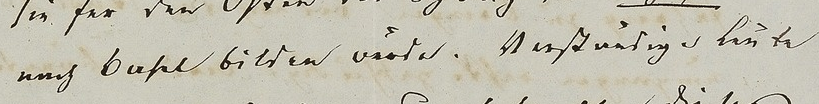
nach Basel bilden würde. Verständige Leute
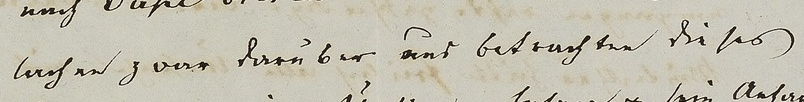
lachen zwar darüber und betrachten dieses
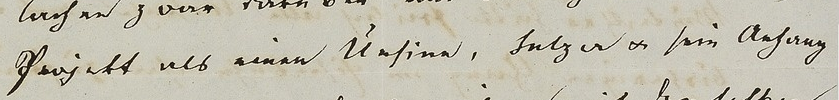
Projekt als einen Unsinn, Sulzer & sein Anhang
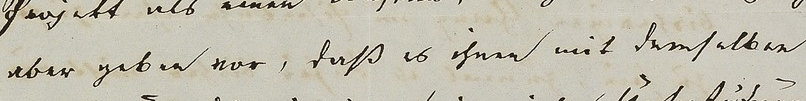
aber geben vor, daß es ihnen mit demselben
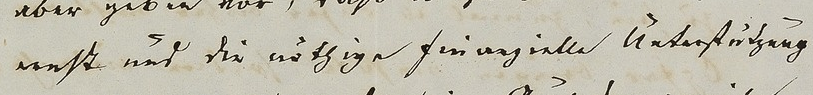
ernst und die nöthige finanzielle Unterstützung
